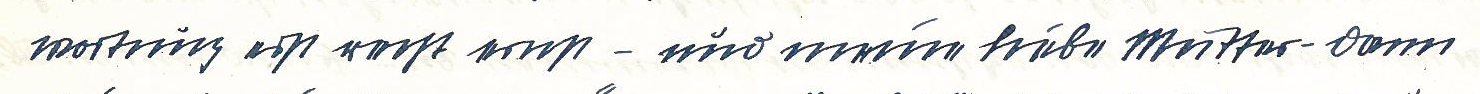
wortung erst recht ernst – und meine liebe Mutter – dann
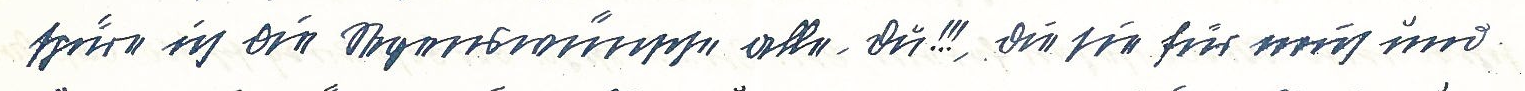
spüre ich die Segenswünsche alle, Du!!!, die sie für mich und
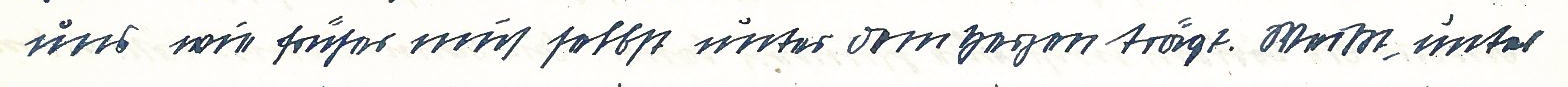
uns wie früher mich selbst unter dem Herzen trägt. Weißt, unter
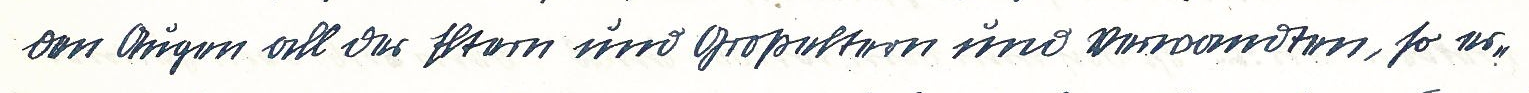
den Augen all der Eltern und Großeltern und Verwandten, so er¬
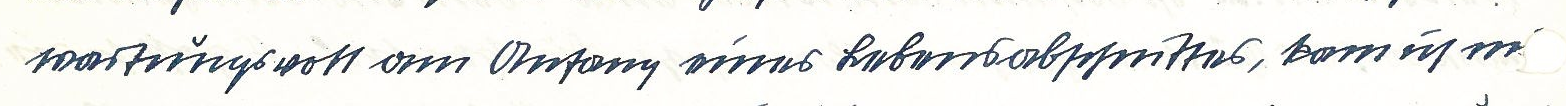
wartungsvoll am Anfang eines Lebensabschnittes, kam ich m
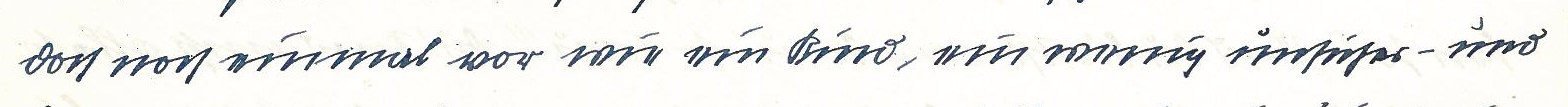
doch noch einmal vor wie ein Kind, ein wenig unsicher – und
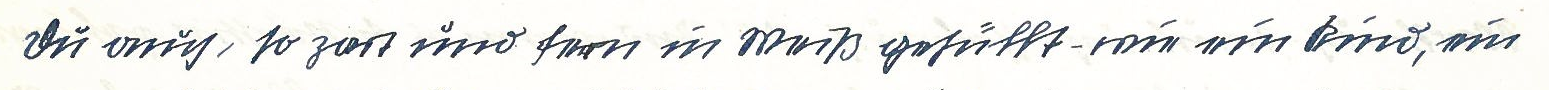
Du auch, so zart und fern in Weiß gehüllt – wie ein Kind, ein
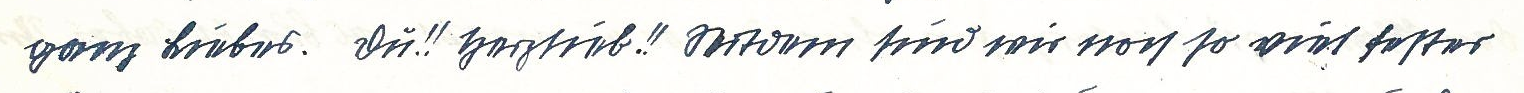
ganz liebes. Du!! Herzlieb!! Seitdem sind wir noch so viel fester
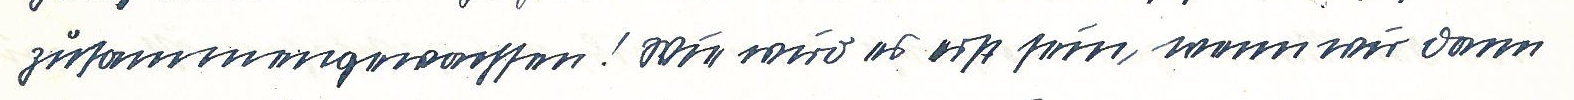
zusammengewachsen! Wie wird es erst sein, wenn wir dann
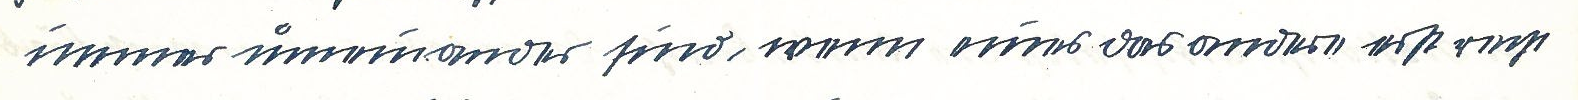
immer umeinander sind, wenn eines das andere erst recht
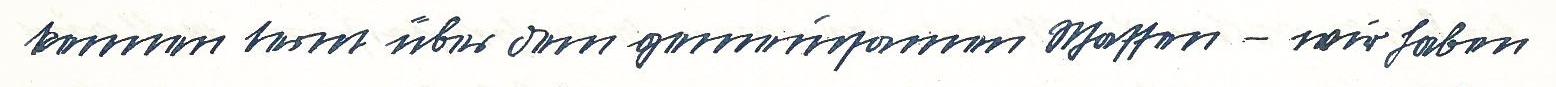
kennen lernt über dem gemeinsamen Schaffen – wir haben
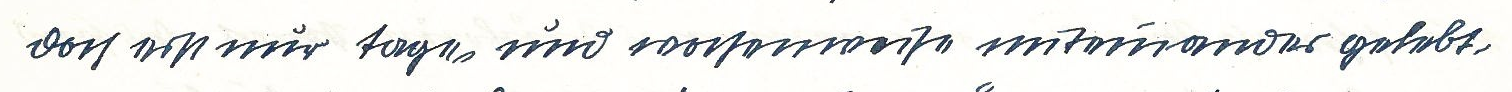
doch erst nur tage– und wochenweise miteinander gelebt,
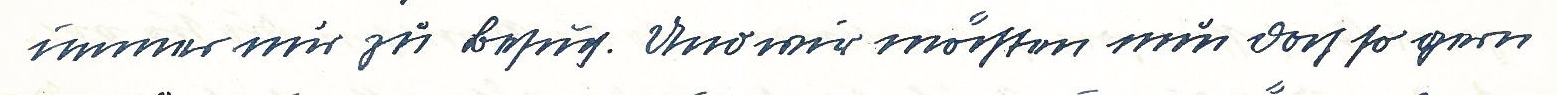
immer nur zu Besuch. Und wir möchten nun doch so gern
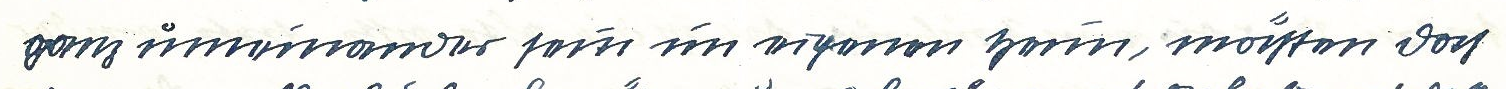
ganz umeinander sein im eigenen Heim, möchten doch
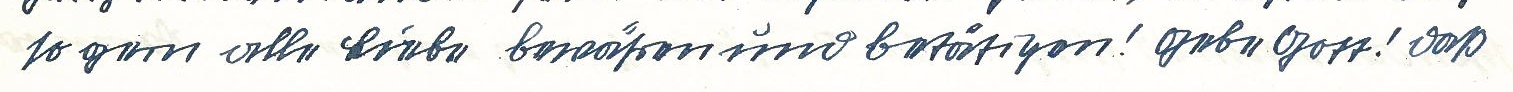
so gern alle Liebe bewähren und betätigen! Gebe Gott! daß
